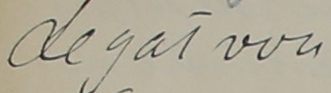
Legat von
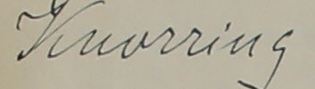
Knorring
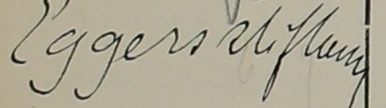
Eggersstiftung
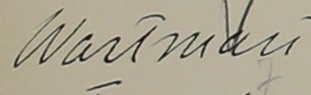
Wartmann
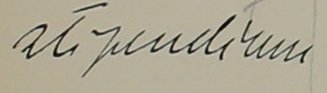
stipendium
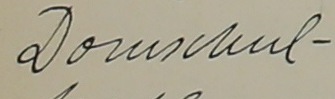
Domschul
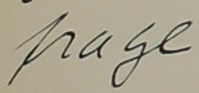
page
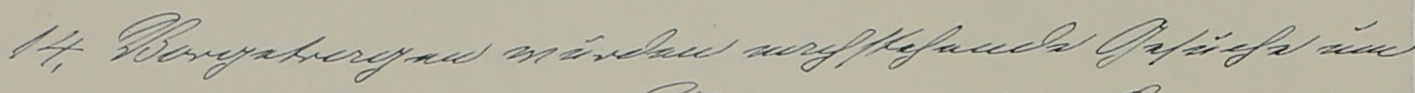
14. Vorgetragen wurden nachstehende Gesuche um
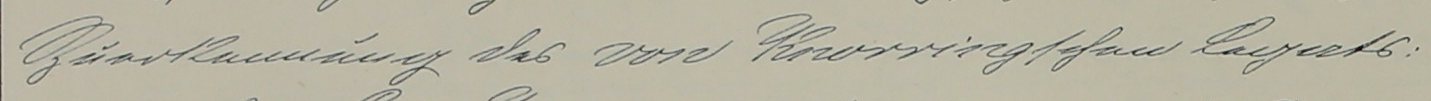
Zuerkennung des von Knorringschen Legats:
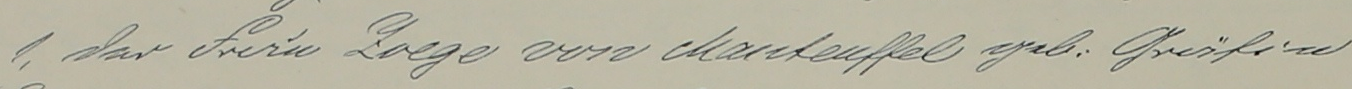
1. der Frau Zoege von Manteuffel geb. Gräfin
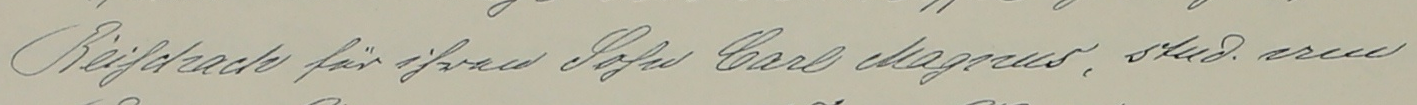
Reischach für ihren Sohn Carl Magnus, stud. am
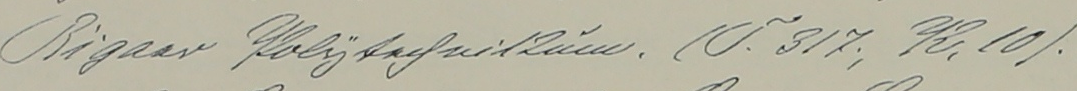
Rigaer Polytechnikum. (T.317; K.10).
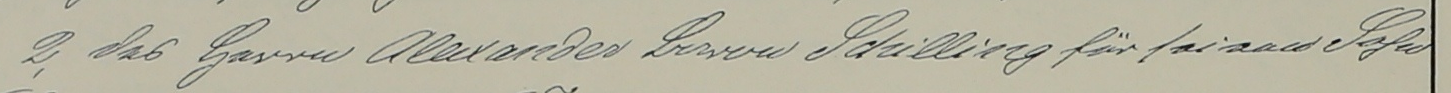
2. des Herrn Alexander Baron Schilling für seinen Sohn
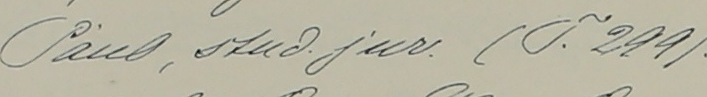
Paul, stud. jur. (T.299).
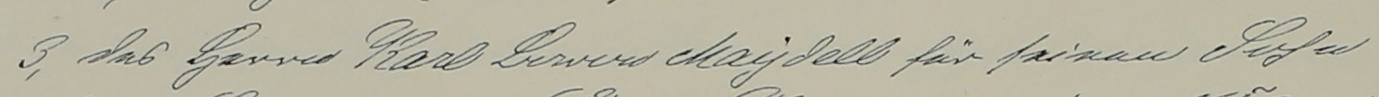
3. des Herrn Karl Baron Maydell für seinen Sohn
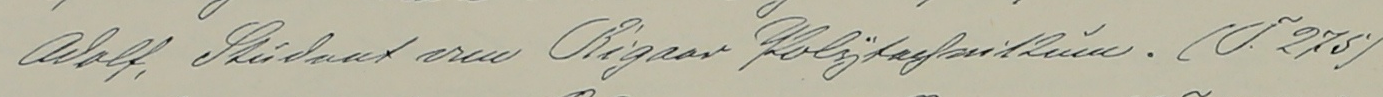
Adolf, Student am Rigaer Polytechnikum. (T.275)
